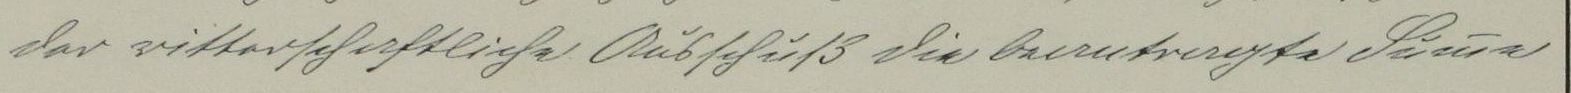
der ritterschaftliche Ausschuß die beantragte Summe
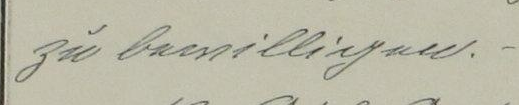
zu bewilligen.
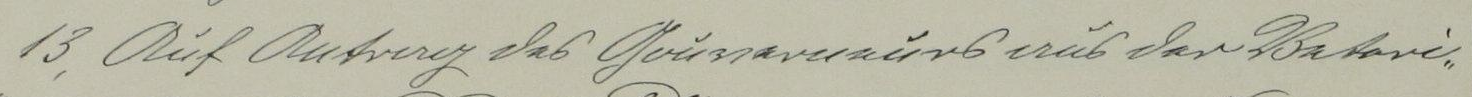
13. Auf Antrag des Gouverneurs aus der Veteri-
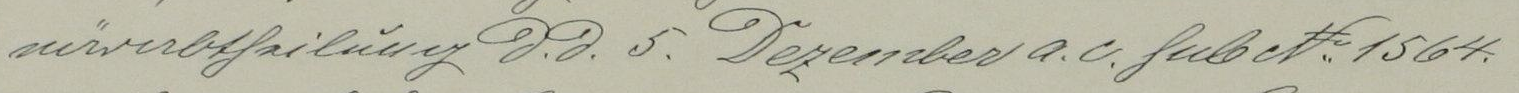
närabtheilung d.d. 5. Dezember a.c. sub No. 1564.
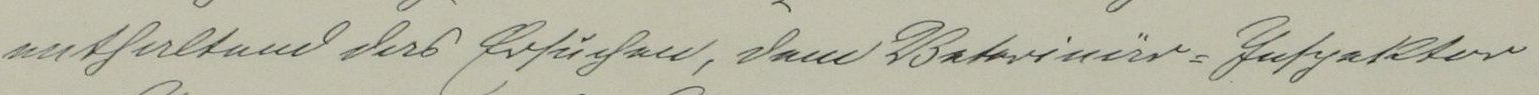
enthaltend das Ersuchen, dem Veterinär-Inspektor
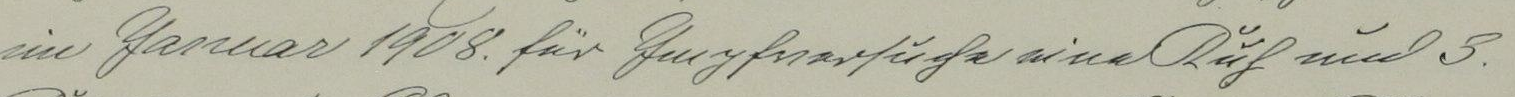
im Januar 1908. für Impfversuche eine Kuh und 3.
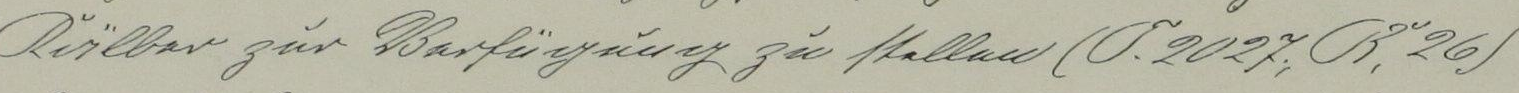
Kälber zur Verfügung zu stellen (T.2027; R.26)
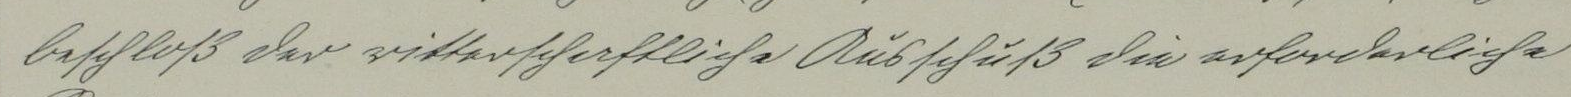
beschloß der ritterschaftliche Ausschuß die erforderliche
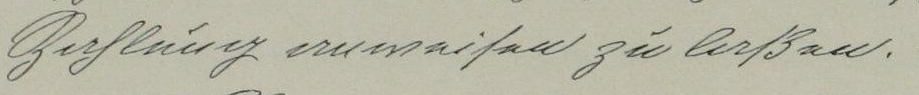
Zahlung anweisen zu laßen.
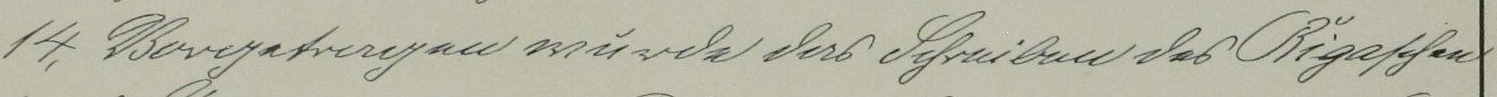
14. Vorgetragen wurde das Schreiben des Rigaschen
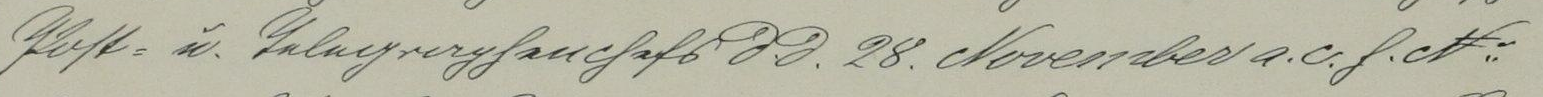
Post- und Telegraphenchefs d.d. 28. November a.c. s. No.
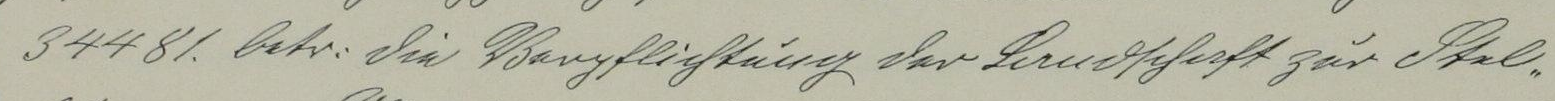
34481. betr. die Verpflichtung der Landschaft zur Stel-
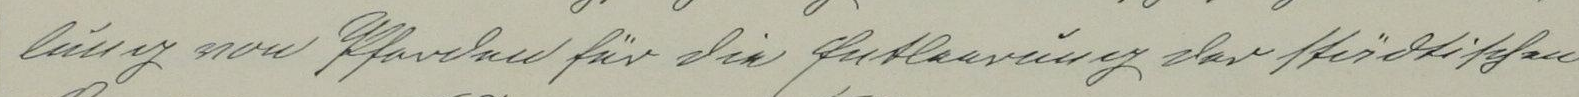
lung von Pferden für die Entleerung der städtischen
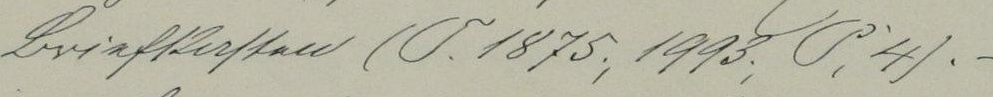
Briefkasten (T.1875; 1993; P.4).
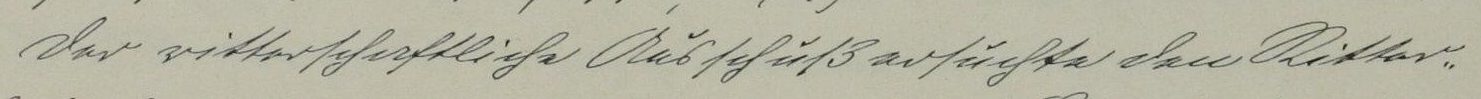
Der ritterschaftliche Ausschuß ersuchte den Ritter-
